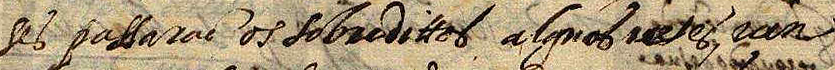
ses, passarão os sobredittos alguās uezes e in
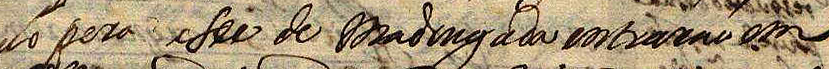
do pera a see de madrugada entraraõ em
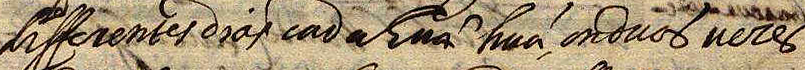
differentes dias cada huā, huā ou duas vezes
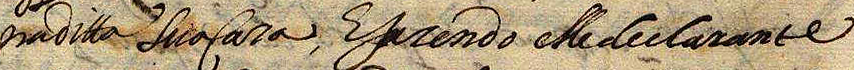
na ditta sua Caza, e jazendo elle declarante
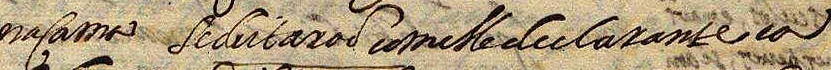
na Cama se deitaraõ com elle declarante ca
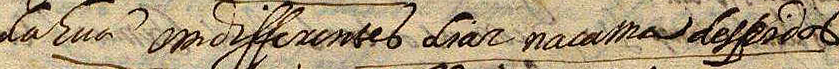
da huā em differentes diaz na cama despidos
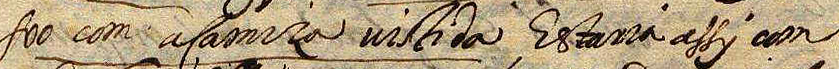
soo com a Camiza uistida, Estaria assy com
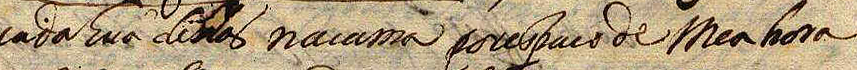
cada huā dellas na cama por espaço de mea hora
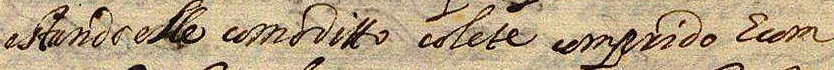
estando elle com o ditto colete comprido e com
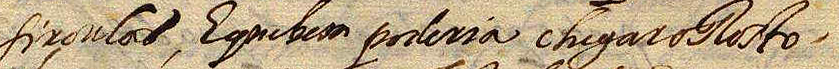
siroulas, e que bem poderia chegar o Rosto
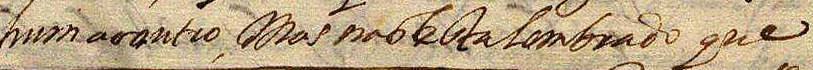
hum ao outro, mas naõ está lembrado que
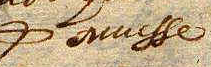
ouuesse
